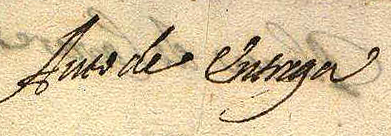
Auto de Entrega
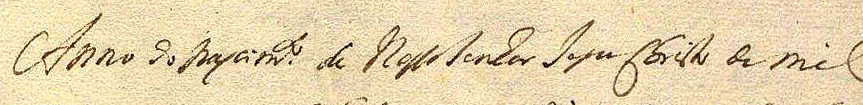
Anno do nascim.to de Nosso Senhor Iesu Christo de mil
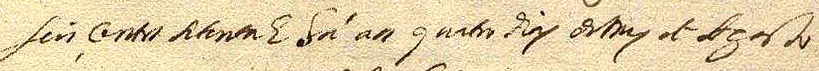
seiscentos setenta E hū aos quatro dias do mes d̄ Agosto
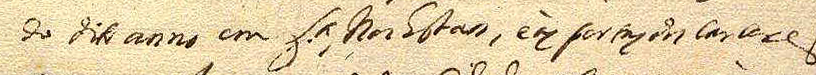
do dito anno em L.a Nos Estaos, e às portas dos carceres
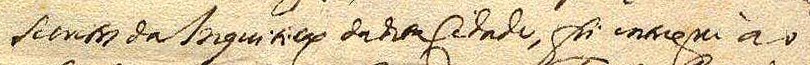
secretos da Inquisiçaõ da dita Cidade, foi entregue ào
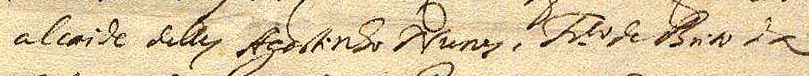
alcaide delles Agostinho Nunes, Fr.co de Brito da
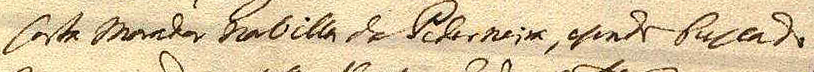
Costa morador na Villa da Pederneira, e sendo buscado
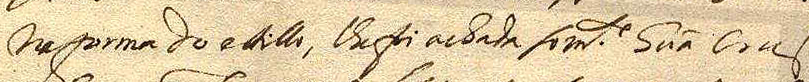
na forma do estillo, lhe foi achada somte huā crus
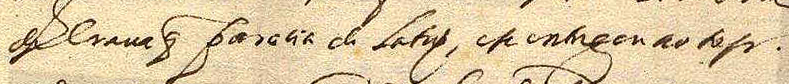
de craua q̄ parecia de Lataõ, e se entregou ao tesr.o
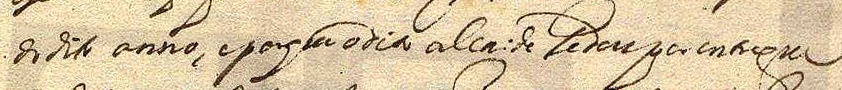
do ditto anno, e porque o dito alcaide se deu por entregue
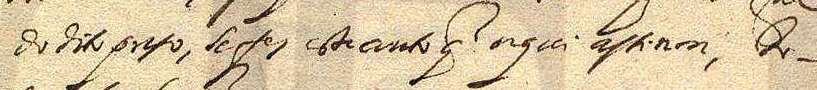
do dito preso, se fes este auto q̄ aqui assinou, Io
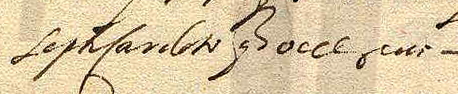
seph Cardoso q̄ o escreui
